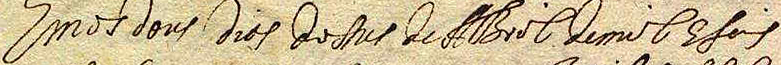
Em os dous dias do Mes de Abril de mil E seis
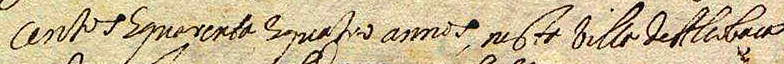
centos E quarenta E quatro annos, nesta villa de Alcobaça
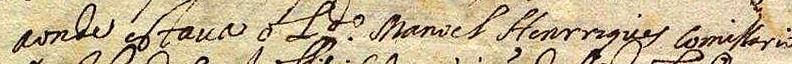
aonde estaua o Ldo. Manoel Henrriques comissario
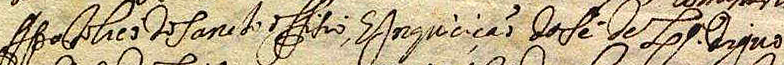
Apostolico do Sancto offisio, E Jnquicição da sé de Lxa. diguo
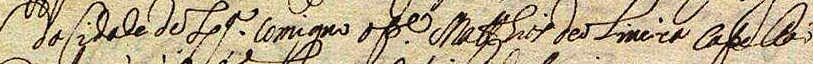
da Cidade de Lxa. comiguo o p.e Matthias de oLiueira Capellaõ
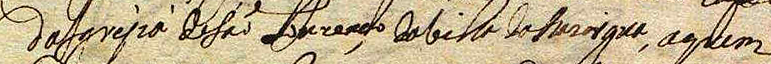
da Jgrejia de saõ Lourenço da villa da Maiorgua, a quem
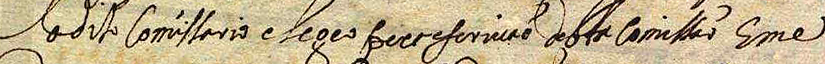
o dito Com̄issario elegeo pera escriuaõ desta comissaõ E me
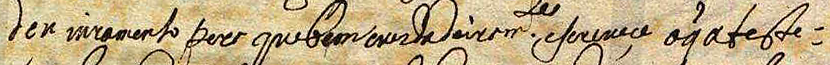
deu iuramento pera que bem e uerdadeiram.te escreueçe o q̄ a teste
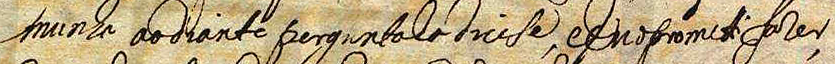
munha ao diante perguntada dicese, e eu o prometti fazer,
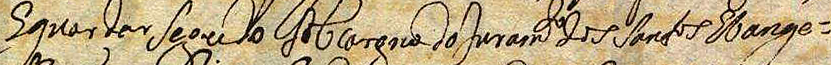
E guardar segredo sob carguo do Juramto dos Santos EVange
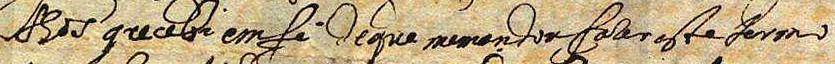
lhos q̄ recebi em fé de que me mandou fazer este termo
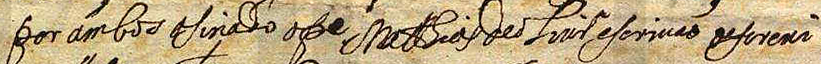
por ambos asinado o pe Matthias de oliura escriuaõ o escreui.
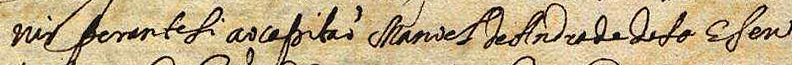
uir perante si ao capitaõ Manoel de Andrade de sa E seu
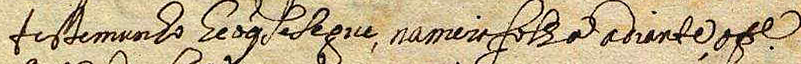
testemunho he o q̄ se segue, na meia folha adiante, o pe.
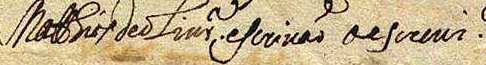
Matthias de oLiura. escriuaõ o escreui.
